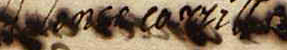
Alonso carrilho
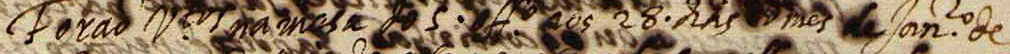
Foraõ V.tos na mesa do s.to off.o aos 28 dias do mes de Jan.ro de
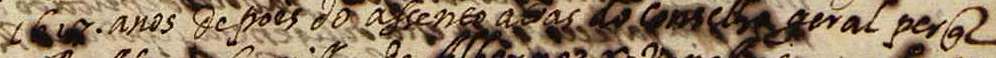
1617. anos depoes do assento atras do conselho geral per q̄
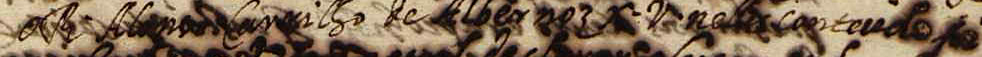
o R . Alonço Carrilho de Albernoz x. v. nelles conteudo foi
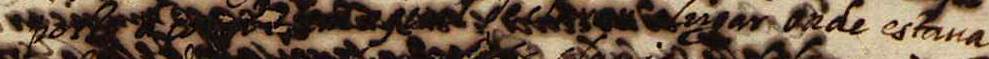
posto a tormto em o qual declarou o lugar onde estaua
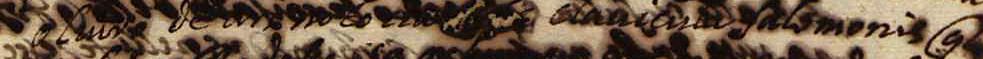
o Liuro de ars notoria _ claruis Salomonis q̄
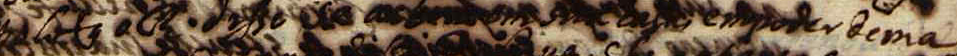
polo q̄ o R. disse se achou em sua casa, em poder de ma
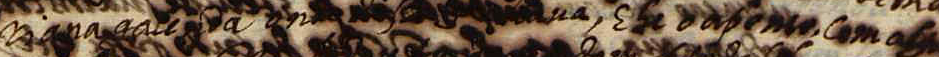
riana galinda onde disse que estaua, E he o apenso, com algus̄
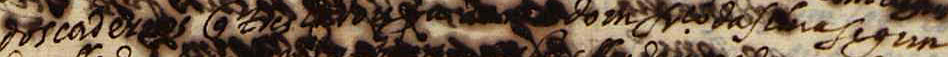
dos cadernos que tresladou ꝑa dar a dom fr.co da silua segun
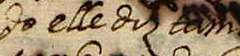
do elle diz tam
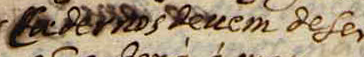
Cadernos deuem de ser
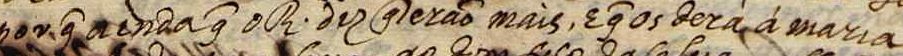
por q̄ ainda q̄ o R. diz q̄ erão mais, E q̄ os dera àa maria
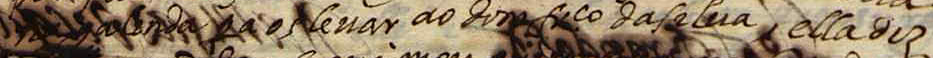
na galianda ꝑa os leuar ao dom fr.co da silua, ella diz
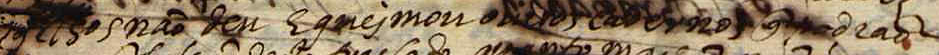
q̄ lhos naõ deu E quejmou outros cadernos q̄ podiaõ
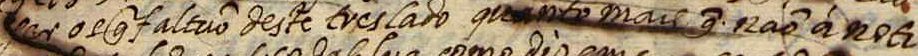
ser os q̄ faltaõ deste treslado quanto mais q̄ não á noti
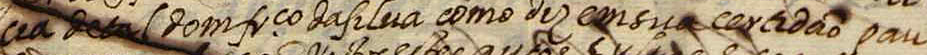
cia de tal dom fr.co da silua como diz em sua certidaõ pau
